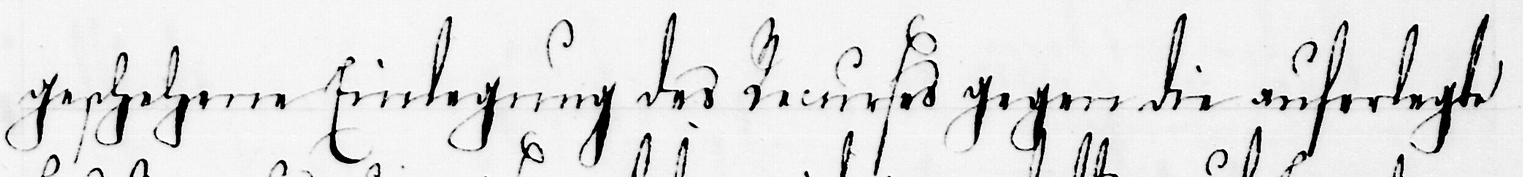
geschehene Einlegung des Recurses gegen die auferlegte
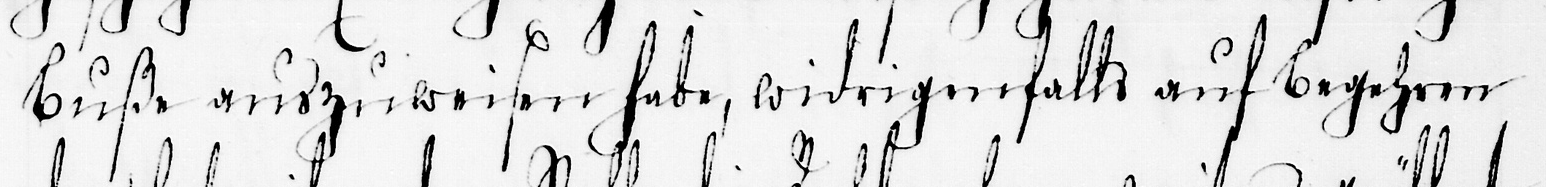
Buße auszuweisen habe, widrigenfalls auf Begehren
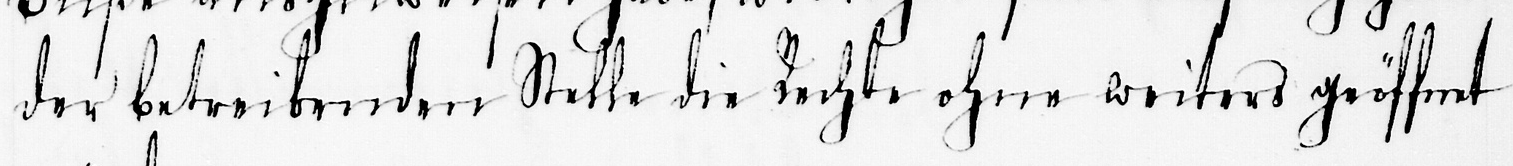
der betreibenden Stelle die Rechte ohne weiters geöffnet
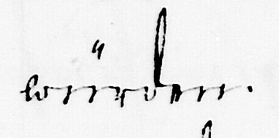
würden.
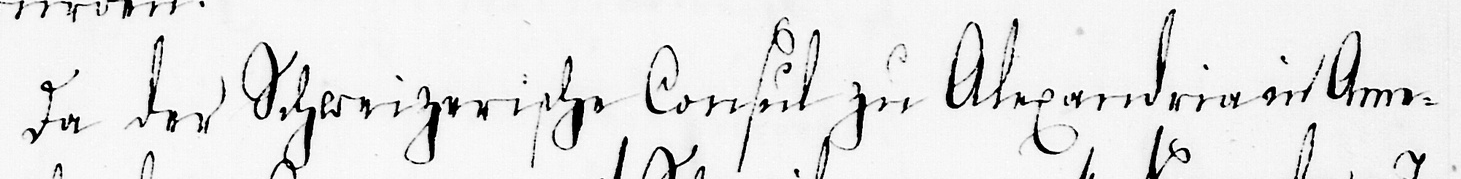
Da der Schweizerische Consul zu Alexandria in Ame¬
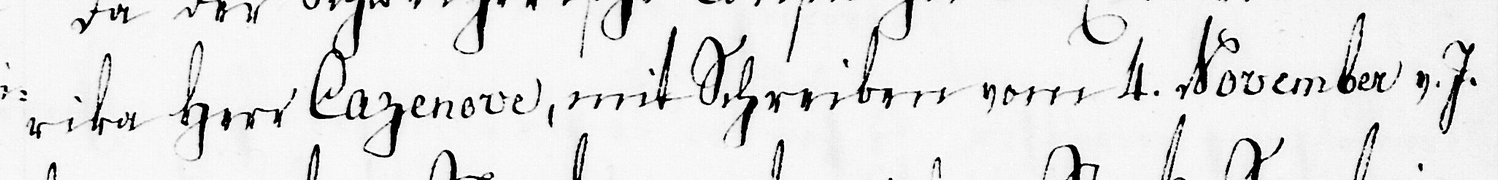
rika Herr Cazenove, mit Schreiben vom 4. November v. J.
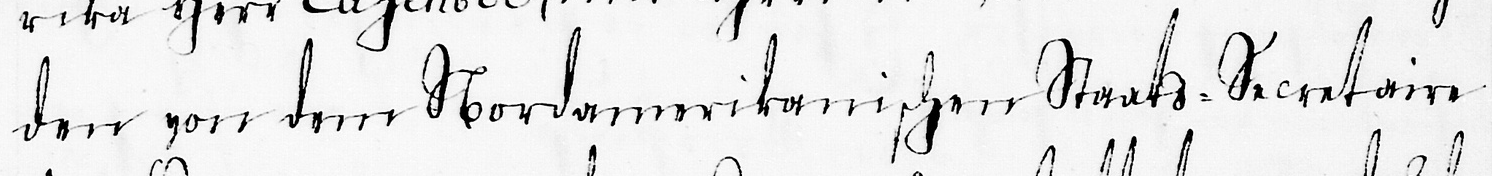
den von dem Nordamerikanischen Staats-Secretaire
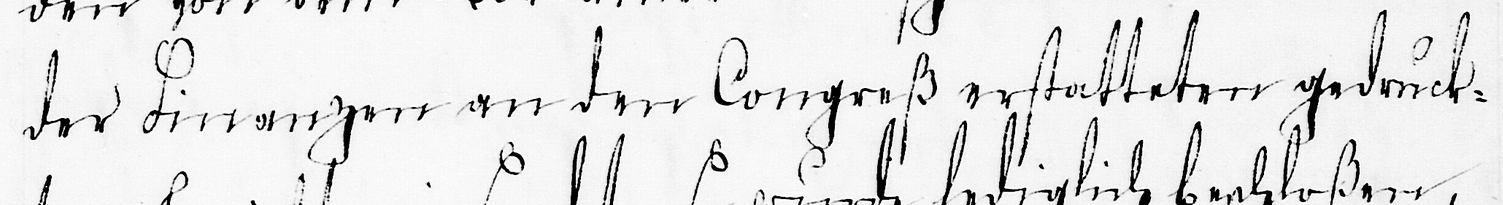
der Finanzen an den Congreß erstatteten gedruck¬
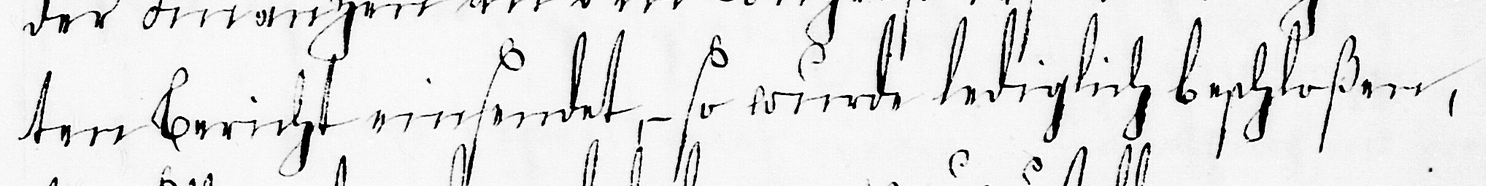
ten Bericht einsendet, – so wurde lediglich beschloßen,
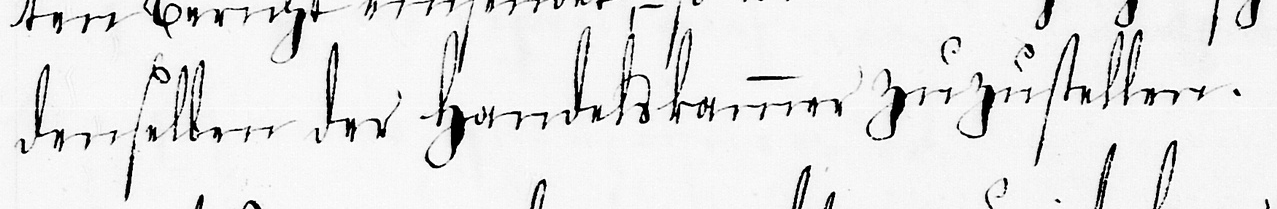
denselben der Handelskammer zuzustellen.
